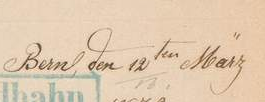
Bern, den 12ten März
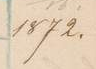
1872.
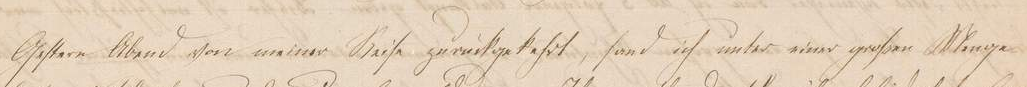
Gestern Abend von meiner Reise zurückgekehrt, fand ich unter einer großen Menge
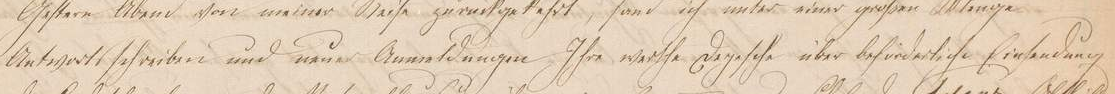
Antwortsschreiben und neuer Anmeldungen Ihre werthe Depesche über beförderliche Einsendung
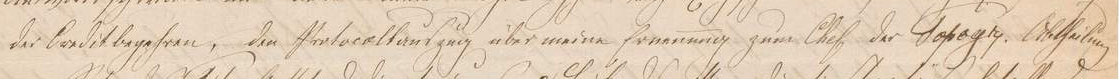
des Creditbegehren, den Protocollauszug über meine Ernennung zum Chef der Topogr. Abtheilung
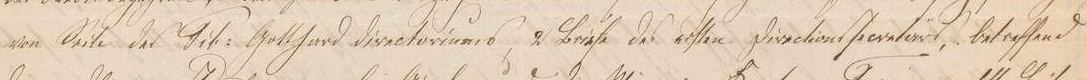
von Seite des Tit: Gotthard Directoriums, 2 Briefe des ersten Directionssecretärs, betreffend
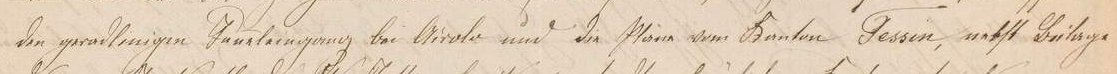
den geradlinigen Tunneleingang bei Airolo und die Pläne vom Kanton Tessin, nebst Beilage
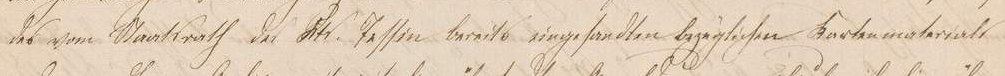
des vom Staatsrath des Kts. Tessin bereits eingesandten bezüglichen Kartenmaterials.
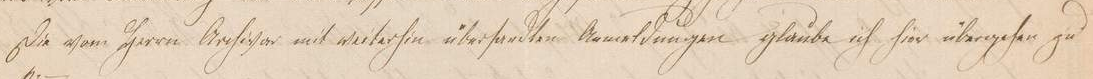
Die vom Herrn Archivar mit weiterhin übersandten Anmeldungen glaube ich hier übergehen zu
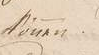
können.
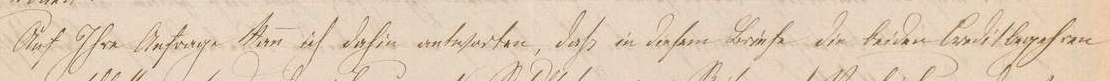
Auf Ihre Anfrage kann ich dahin antworten, daß in diesem Briefe die beiden Creditbegehren
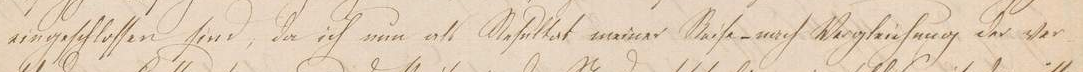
eingeschlossen sind, da ich nun als Resultat meiner Reise – nach Vergleichung der ver-
